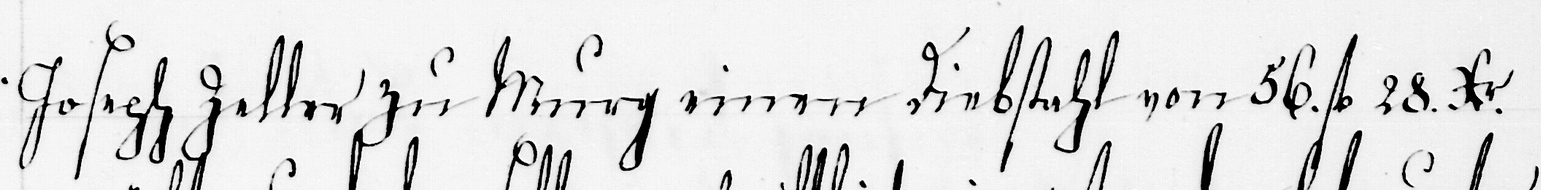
Joseph Zeller zu Murg einen Diebstahl von 56. fl. 28.
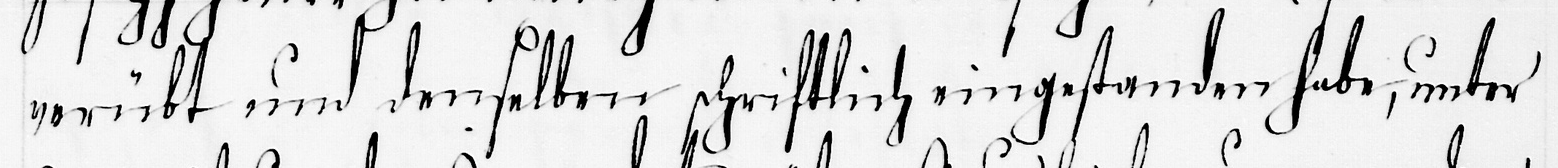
verübt und denselben schriftlich eingestanden habe, unter
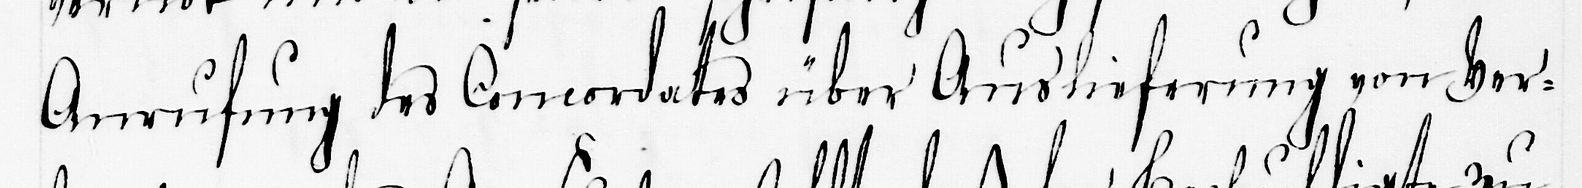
Anrufung des Concordates über Auslieferung von Ver¬
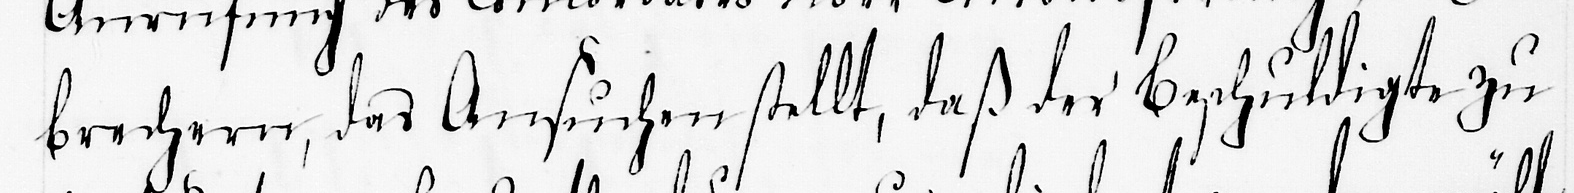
brechern, das Ansuchen stellt, daß der Beschuldigte zu
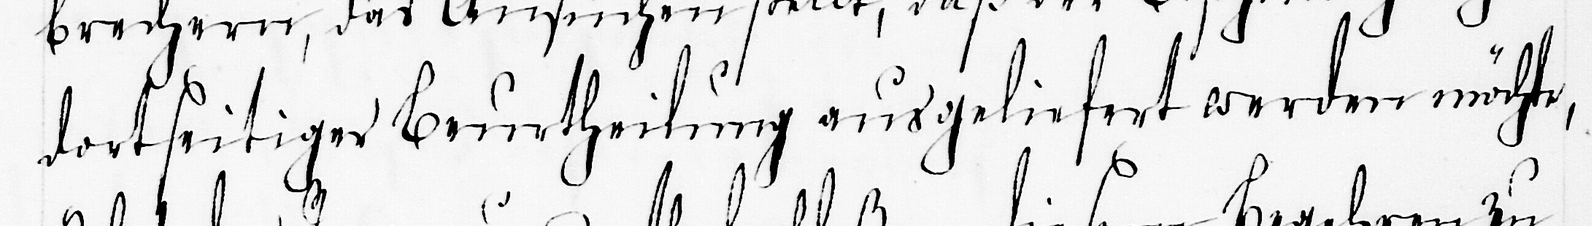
dortseitiger Beurtheilung ausgeliefert werden möchte,
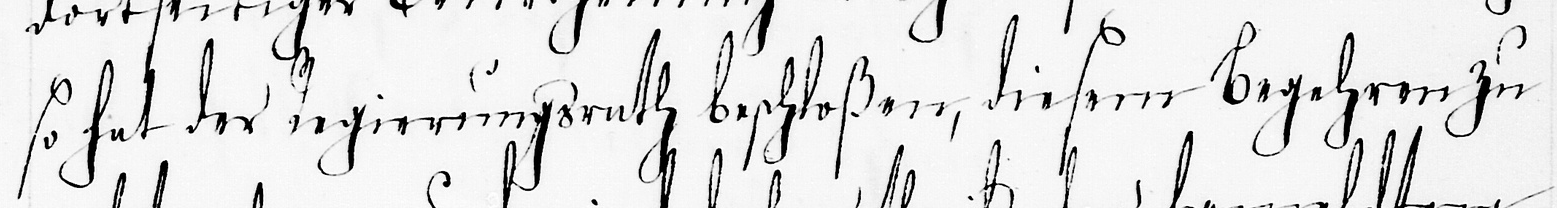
so hat der Regierungsrath beschloßen, diesem Begehren zu
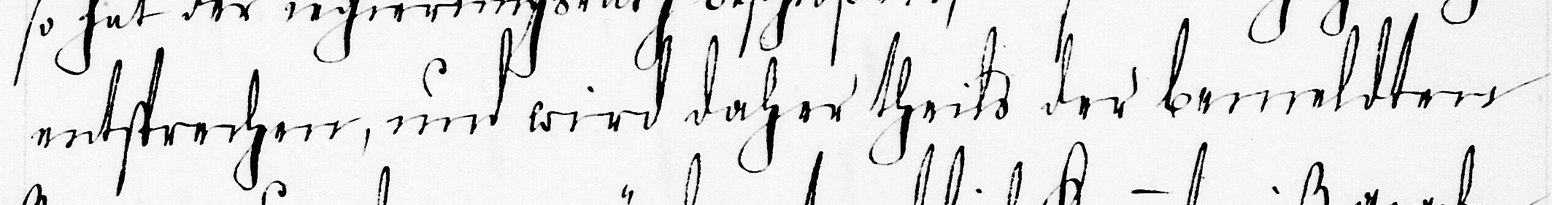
entsprechen, und wird daher theils der bemeldten
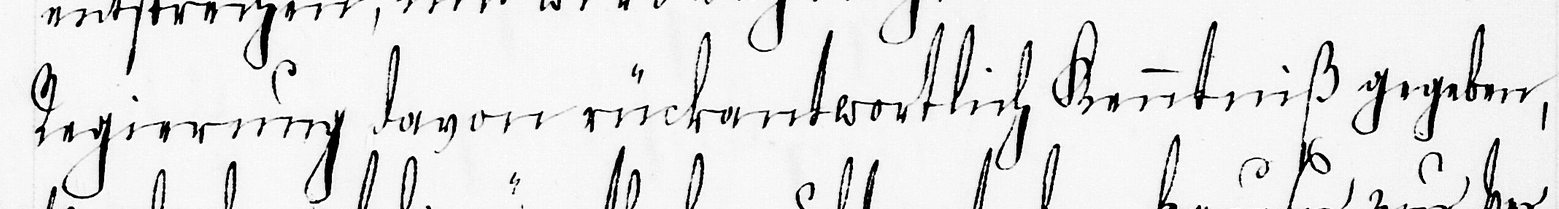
Regierung davon rückantwortlich Kenntniß gegeben,
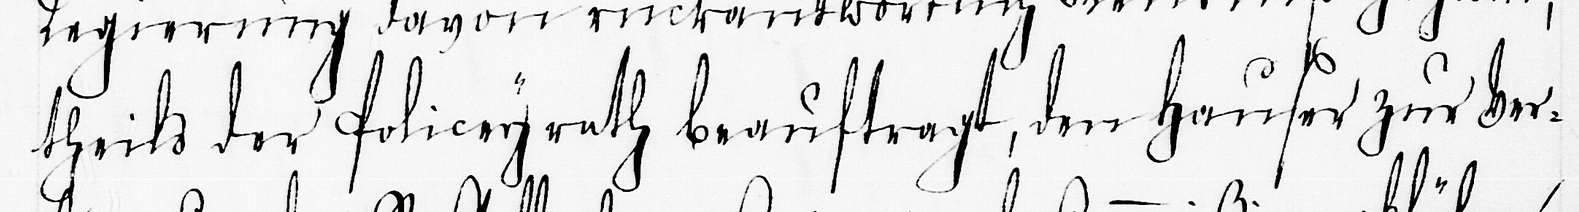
theils der Policeyrath beauftragt, den Hauser zur Ver¬
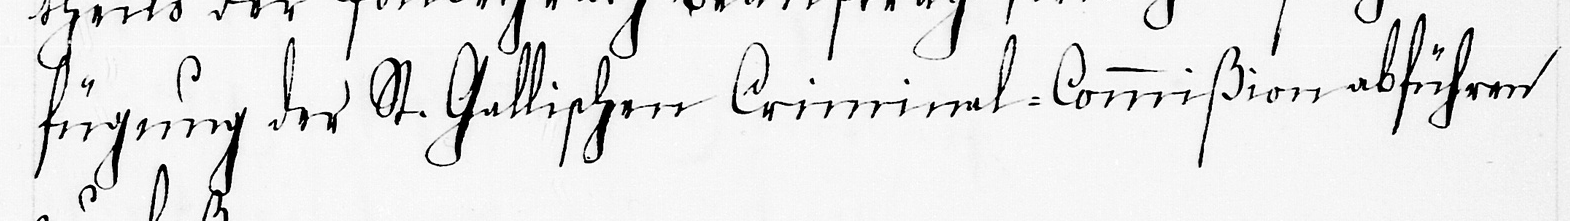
fügung der St. Gallischen Criminal-Commißion abführen
